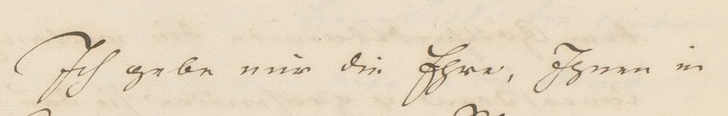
Ich gebe mir die Ehre, Ihnen in
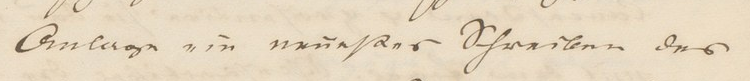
Anlage ein neuestes Schreiben des
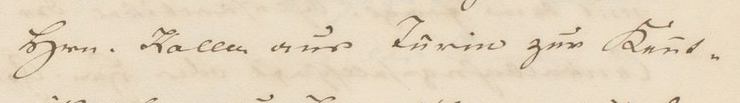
Hrn. Koller aus Turin zur Kennt-
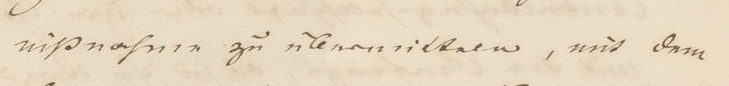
nißnahme zu übermitteln, mit dem
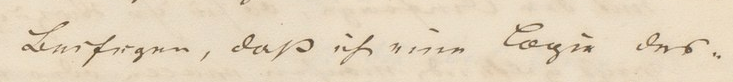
Beifügen, daß ich eine Copie des-
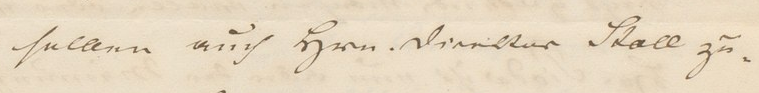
selben auch Hrn. Direktor Stoll zu-
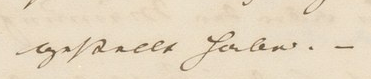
gestellt habe. –
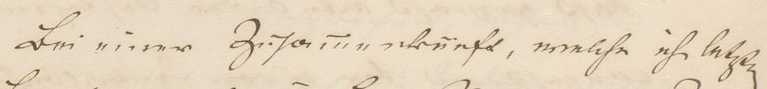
Bei einer Zusammenkunft, welche ich letzten
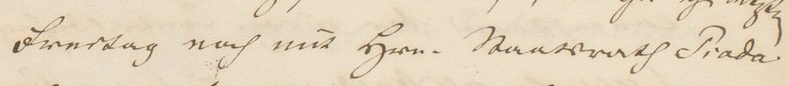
Freitag noch mit Hrn. Staatsrath Pioda
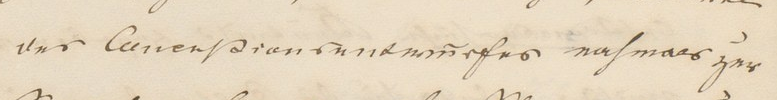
des Conceßionsentwurfes nochmals zur
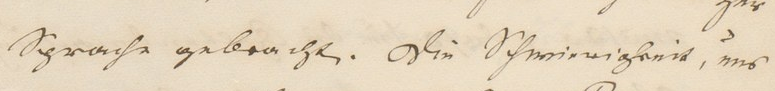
Sprache gebracht. Die Schwierigkeit, uns
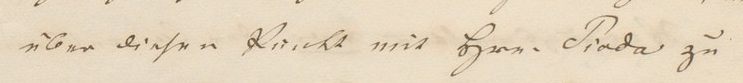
über diesen Punkt mit Hrn. Pioda zu
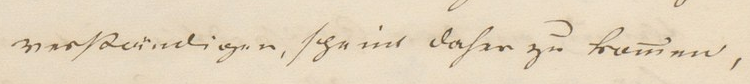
verständigen, scheint daher zu kommen,
